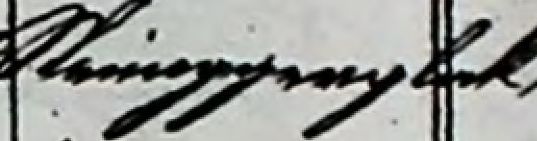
Steine???
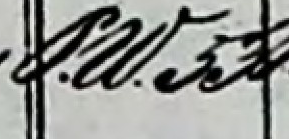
P.W. 53
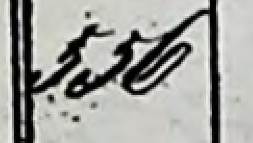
556
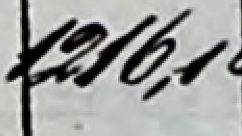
1216,1
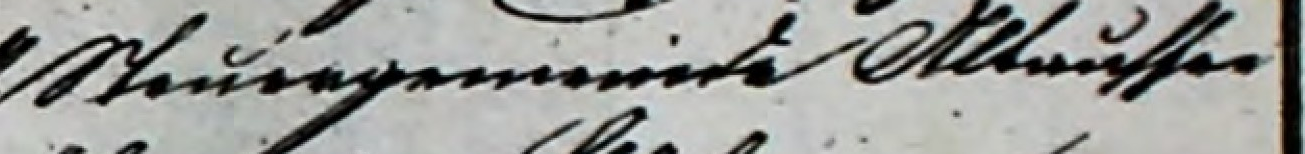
Steuergemeinde Altaussee
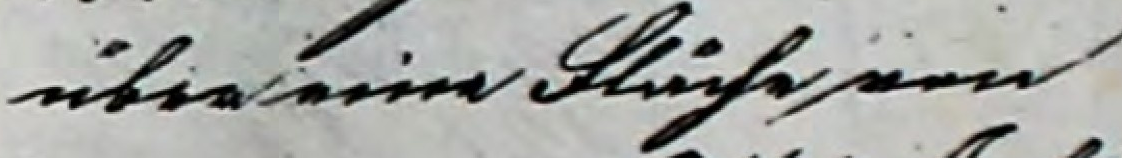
über eine Fläche von
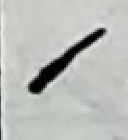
1
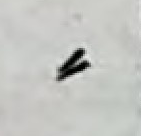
„
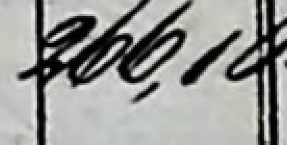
266,1
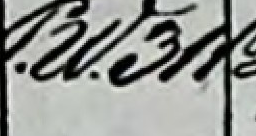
P.W. 311
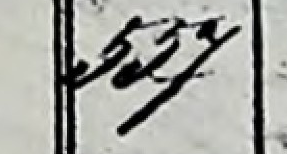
557
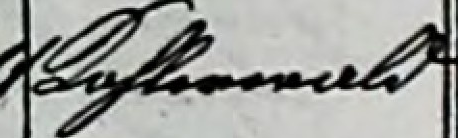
Kohlerwald
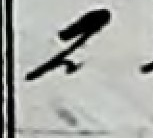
2
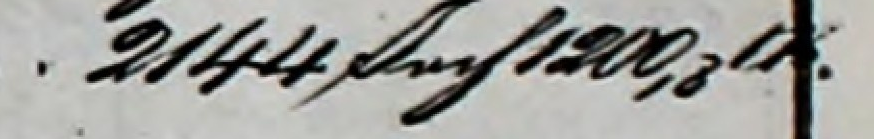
....... 2144 Joch
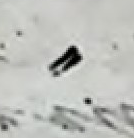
„
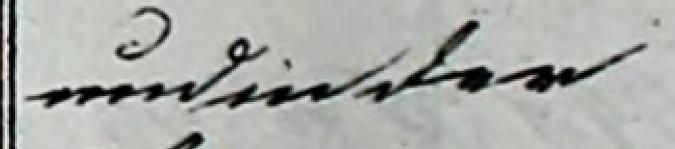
1200, ? K.
